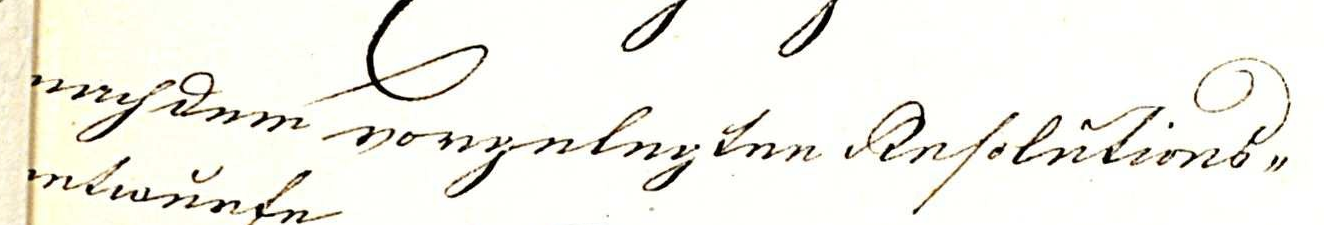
Nach dem vorgelegten Resolutions¬
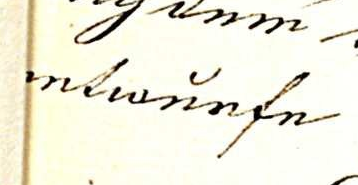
entwurfe
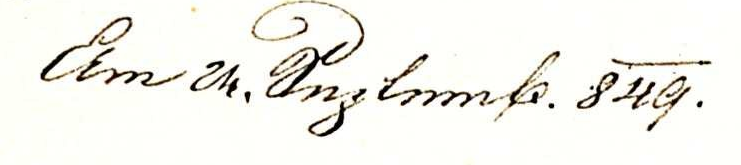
Am 24. Septemb. 849
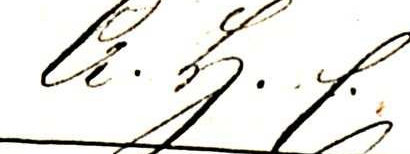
AH E
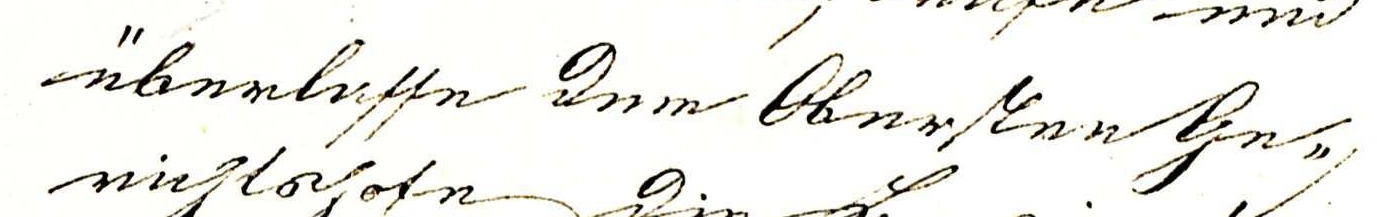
überlasse dem Obersten Ge¬
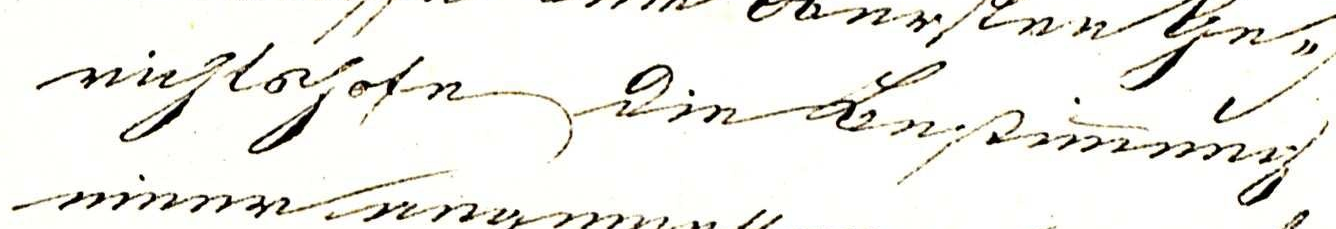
richtshofe die Bestimmung
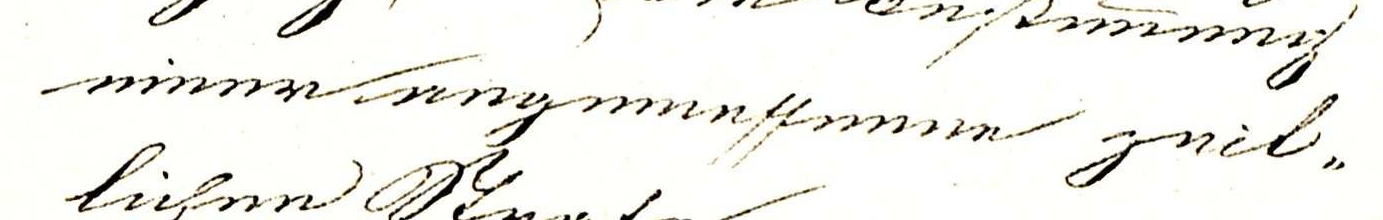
einer angemessenen zeit¬
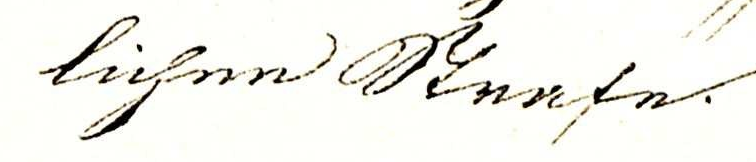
lichen Strafe.
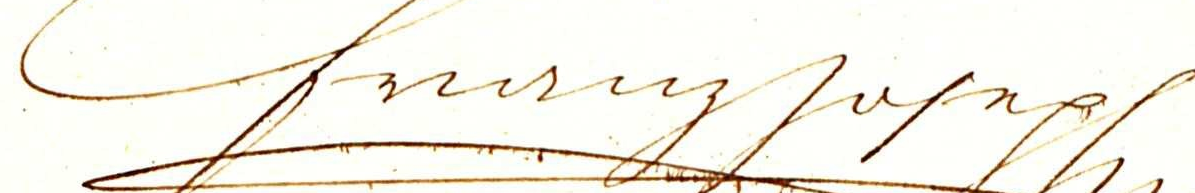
Franz Joseph
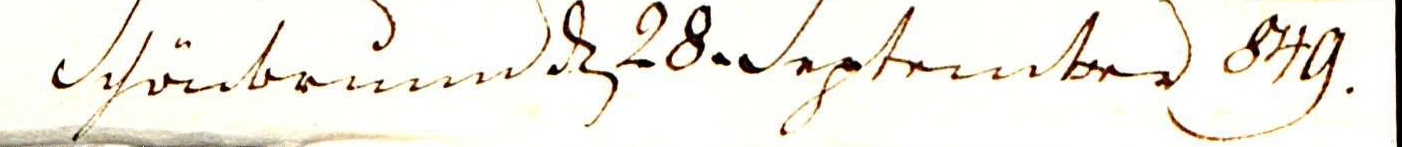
Schönbrunn, 28. September 1849
